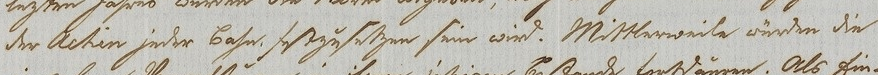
der Actien jeder Bahn festzusetzen sein wird. Mittlerweile würden die
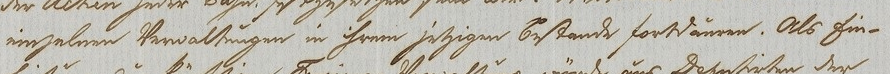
einzelnen Verwaltungen in ihrem jetzigen Bestande fortdauern. Als Ein-
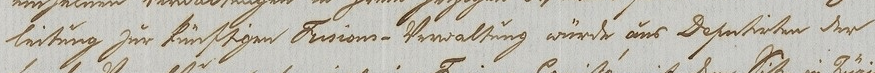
leitung zur künftigen Fusions-Verwaltung würde aus Deputirten der
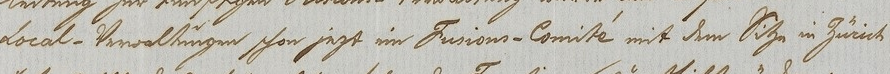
Local-Verwaltungen schon jezt ein Fusions-Comité mit dem Sitze in Zürich
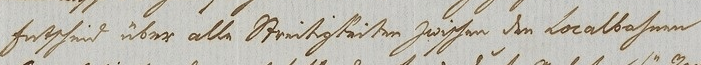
Entscheid über alle Streitigkeiten zwischen den Localbahnen
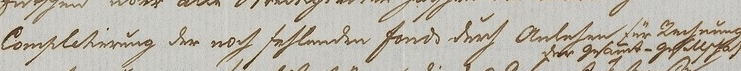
Completierung der noch fehlenden Fonds durch Anlehen für Rechnung
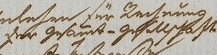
der Gesammt-Gesellschaft
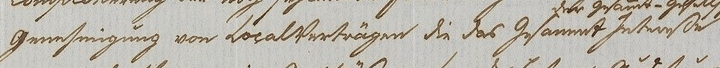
Genehmigung von LocalVerträgen die das Gesammt Intereße
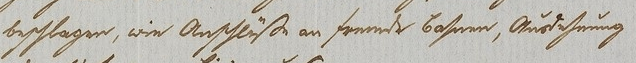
beschlagen, wie Anschlüße an fremde Bahnen, Ausdehnung
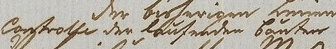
Controlle der laufenden Bauten
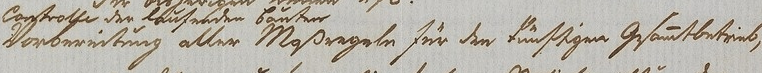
Vorbereitung aller Maßregeln für den künftigen Gesammtbetrieb,
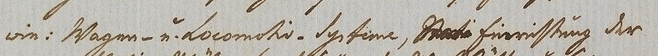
wie: Wagen- u. Locomotiv-Systeme, Statio Einrichtung der
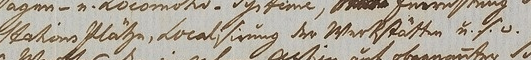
Stations Plätze, Localisirung der Werkstätten u. s. w.
